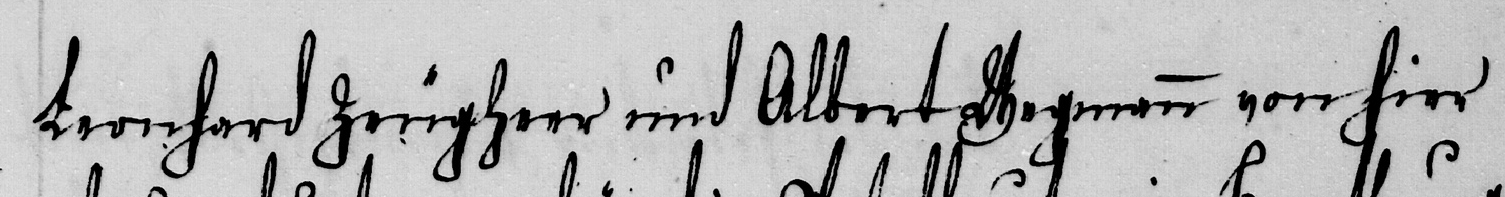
Leonhard Zeugheer und Albert Wegmann von hier
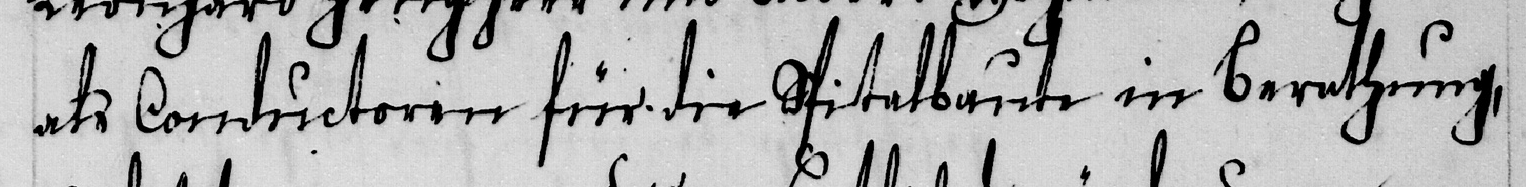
als Conductoren für die Spitalbaute in Berathung,
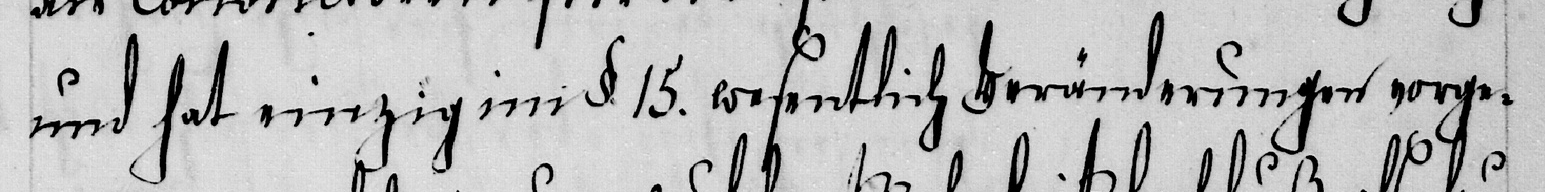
und hat einzig im § 15. wesentlich Veränderungen vorge¬
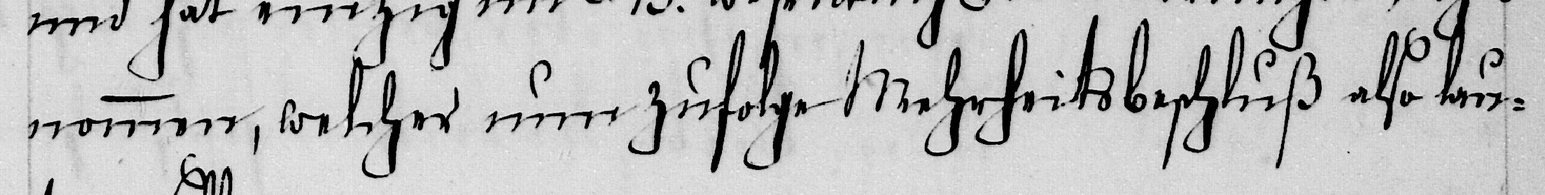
nommen, welcher nun zufolge MehrheitsBeschluß also lau¬
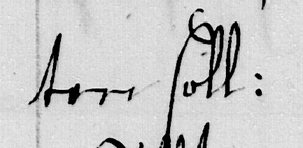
ten soll:
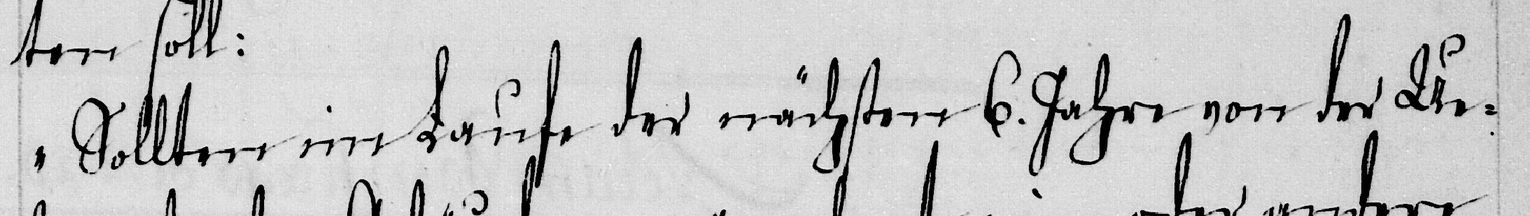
„Sollten im Laufe der nächsten 6. Jahre von der Ue¬
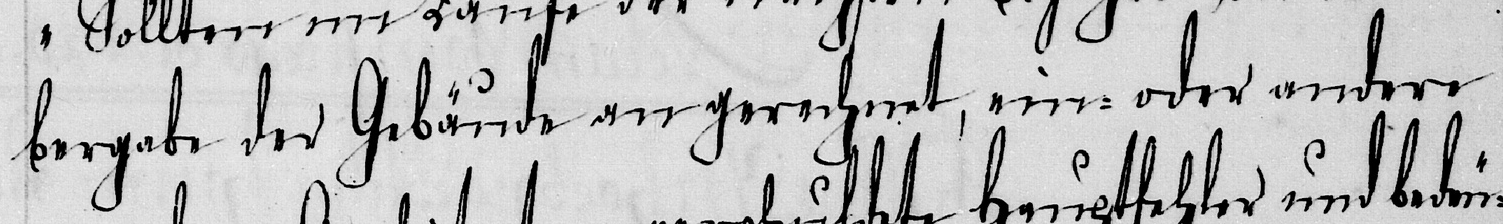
bergabe der Gebäude an gerechnet, ein- oder andere
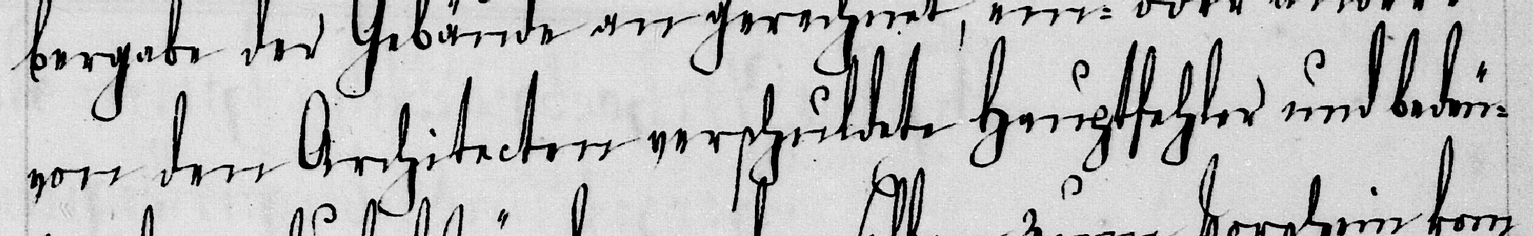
von den Architecten verschuldete Hauptfehler und bede¬
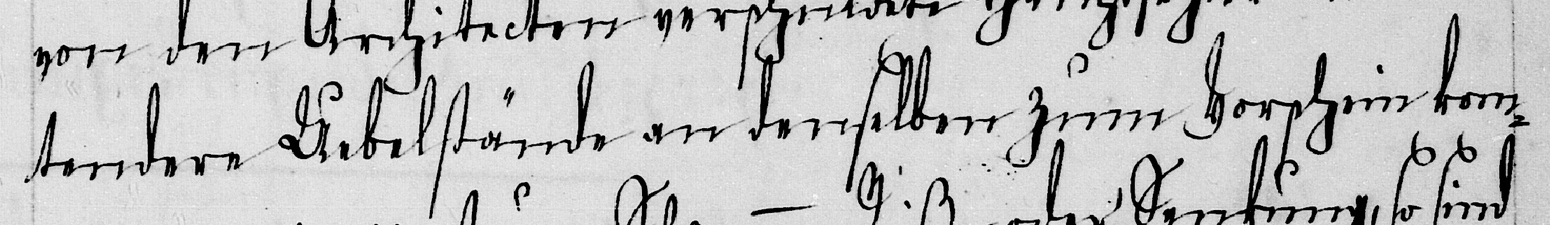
utendere Uebelstände an denselben zum Vorschein kom¬
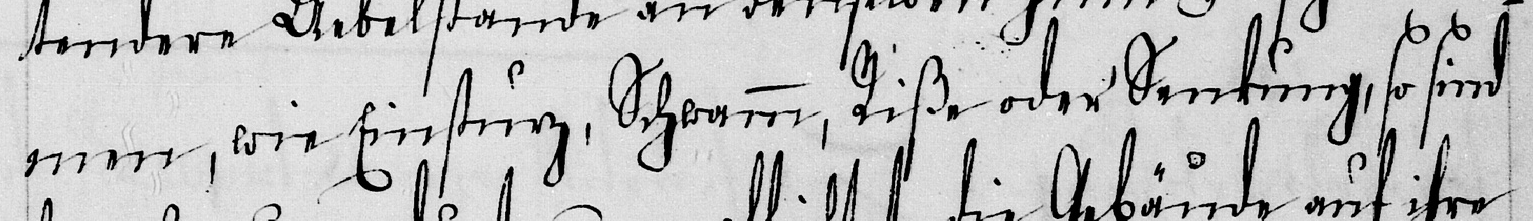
men, wie Einsturz, Schwamm, Riße oder Senkung, so sind
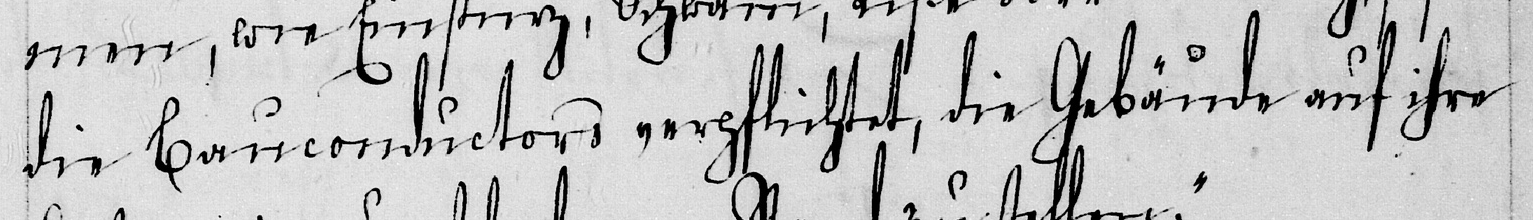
die Bauconductors verpflichtet, die Gebäude auf ihre
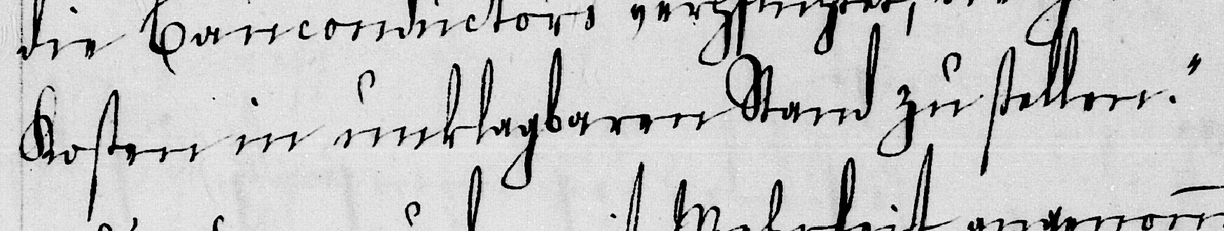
Kosten in unklagbaren Stand zu stellen.“
